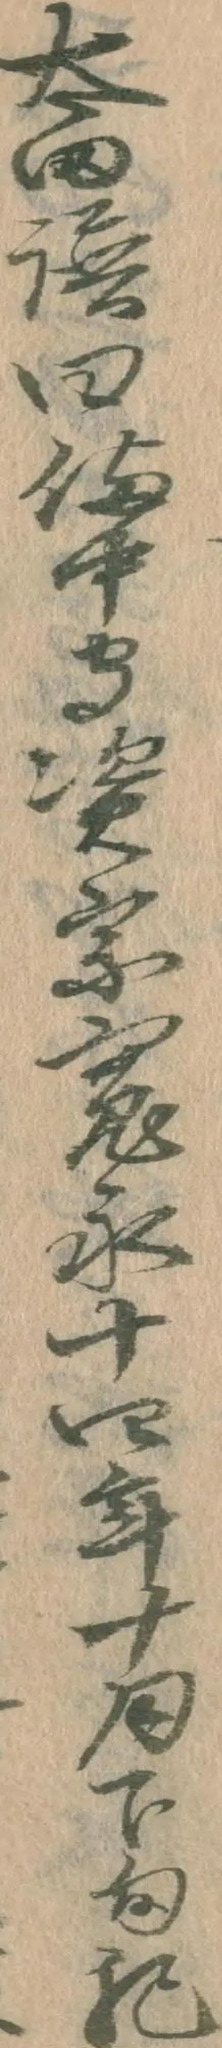太田譜曰備中守資宗寛永十四年十月下旬肥
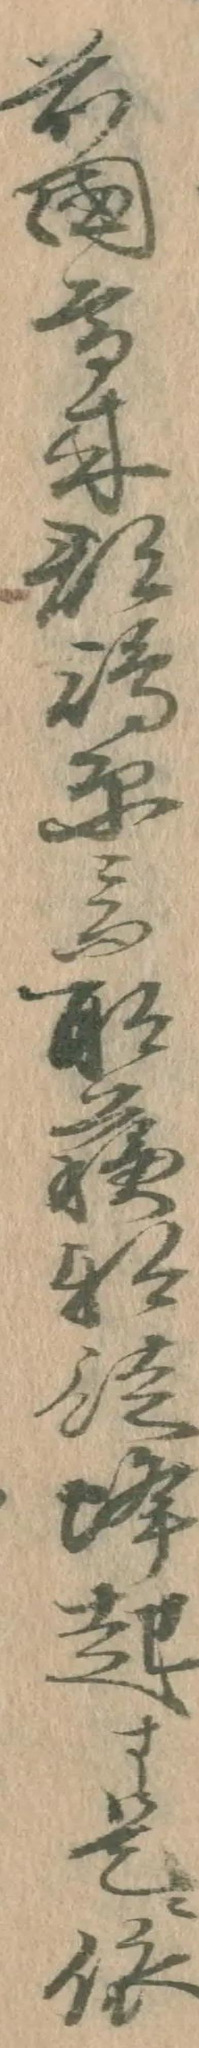前国高来郡島原に而耶蘇邪徒蜂起す是に依
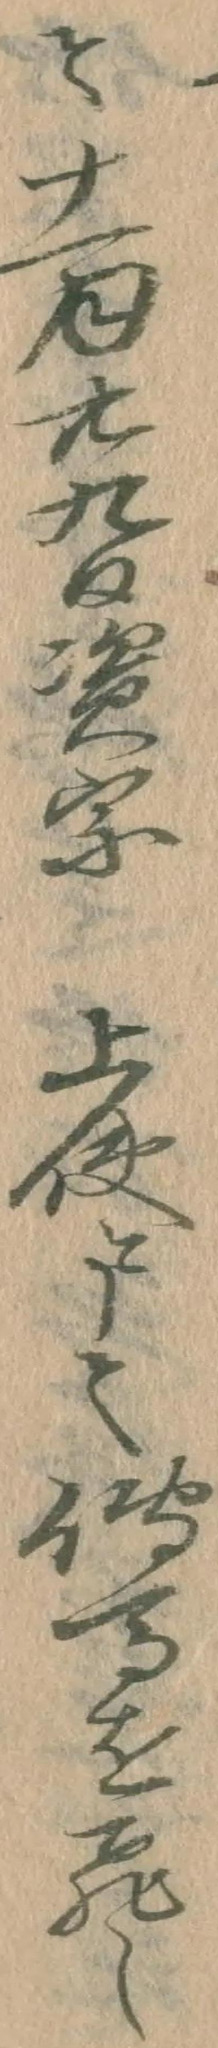て十一月廿九日資宗上使として伝馬を飛し
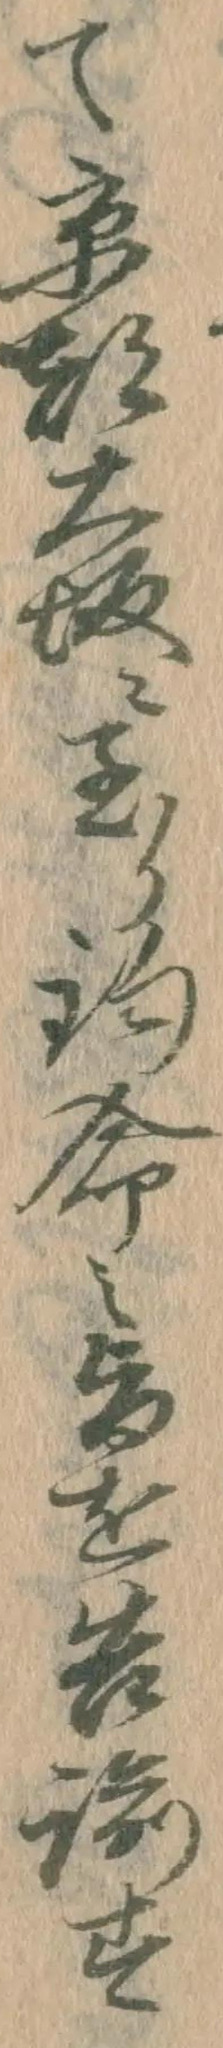て京都大坂に至り鈞命之旨を告諭す

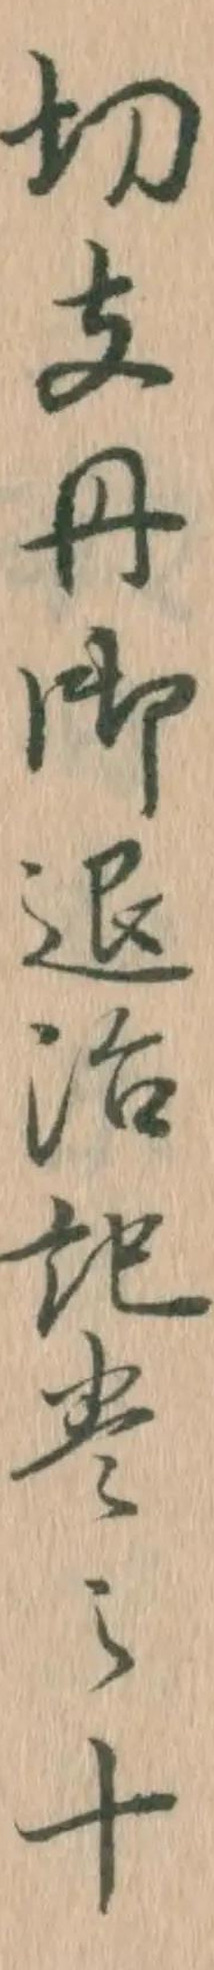切支丹御退治記巻之十
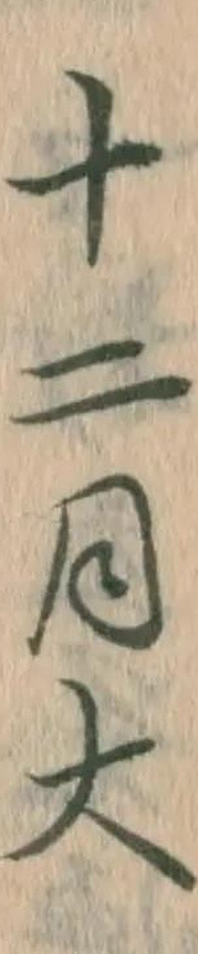十二月大
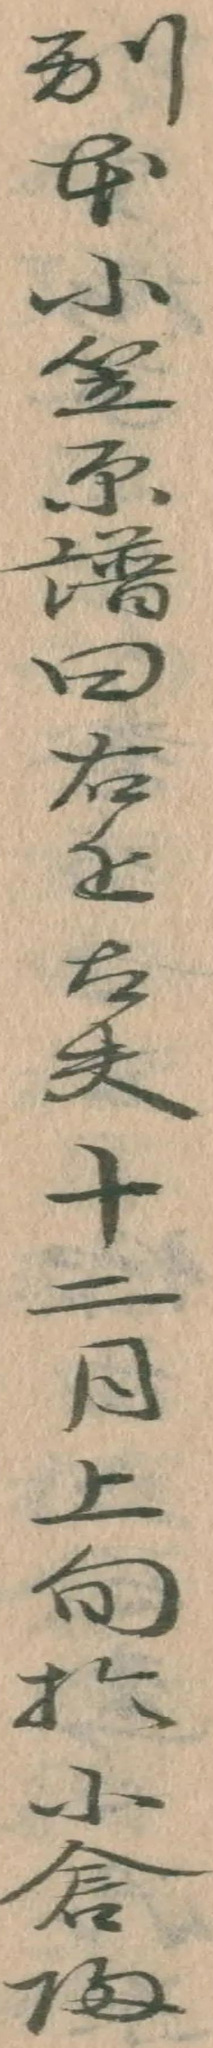別本小笠原譜曰右近太夫十二月上旬於小倉帰
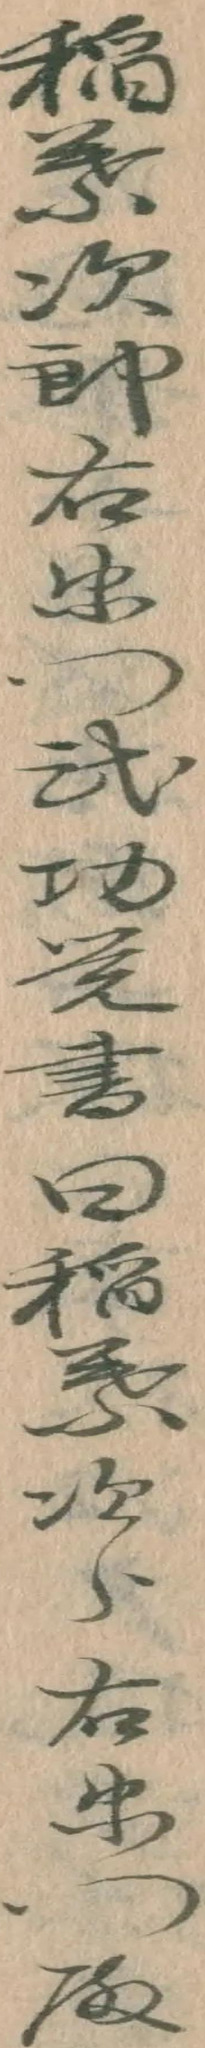稲葉次郎右衛門武功覚書曰稲葉次郎右衛門殿
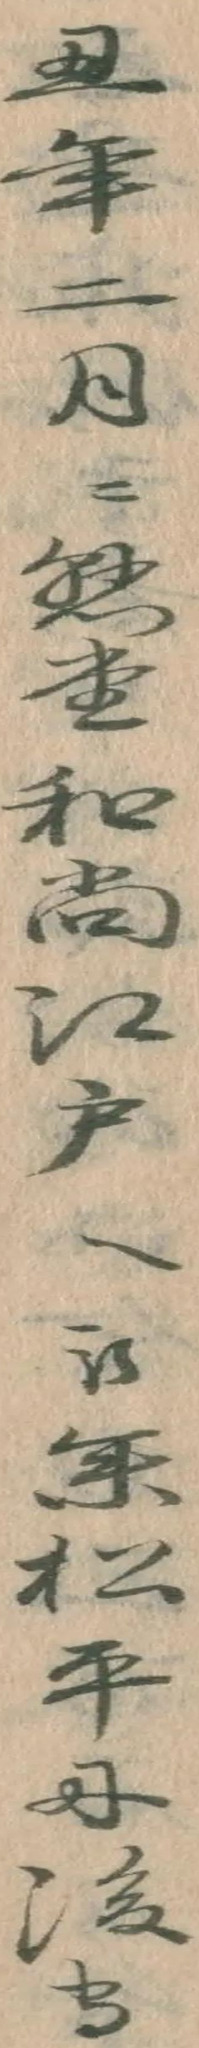丑年二月に懸堂和尚江戸へ被参松平丹後守
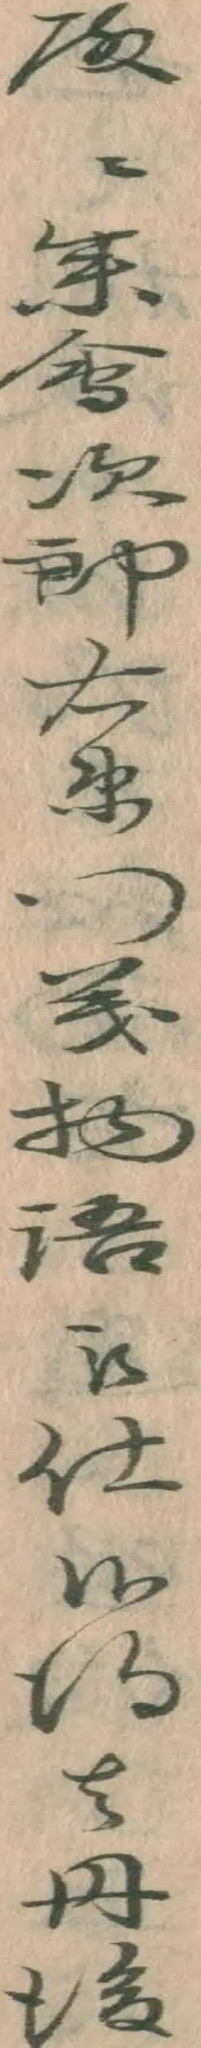殿に参会次郎右衛門義物語被仕候得は丹後
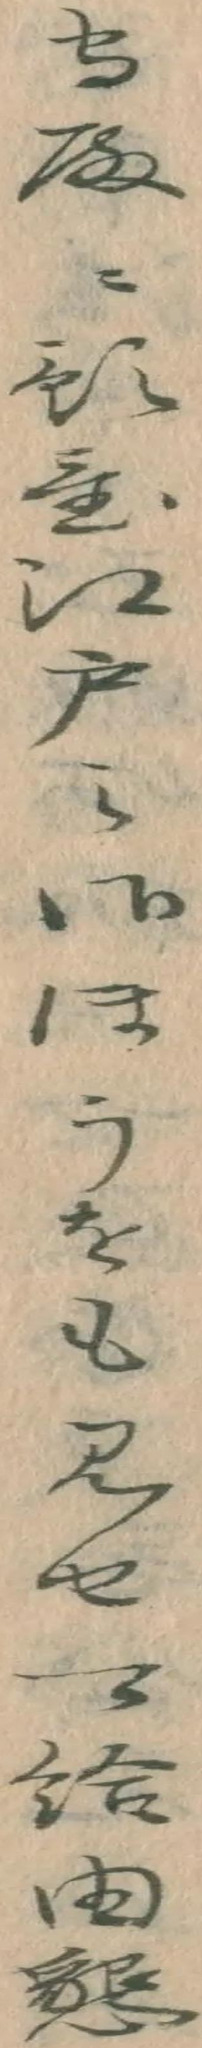守殿に預置江戸之御ほうをも見せ可給由懇
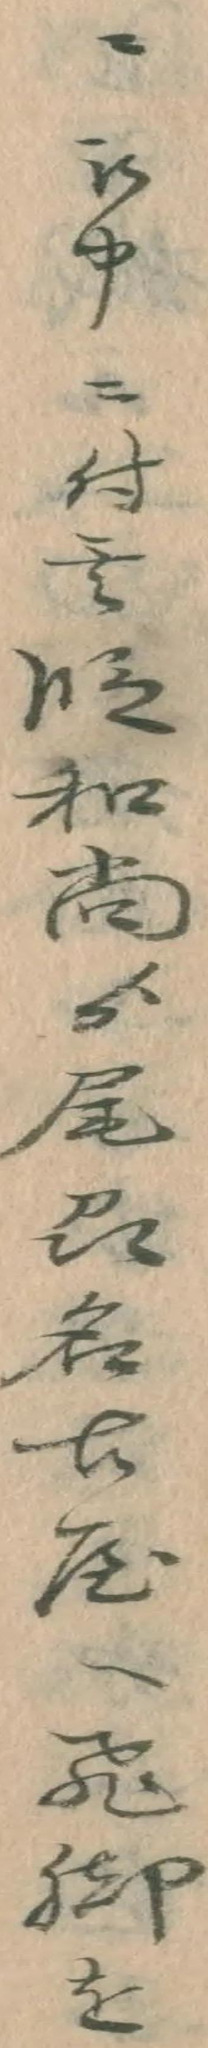に被申に付其段和尚ゟ尾州名古屋へ飛脚を

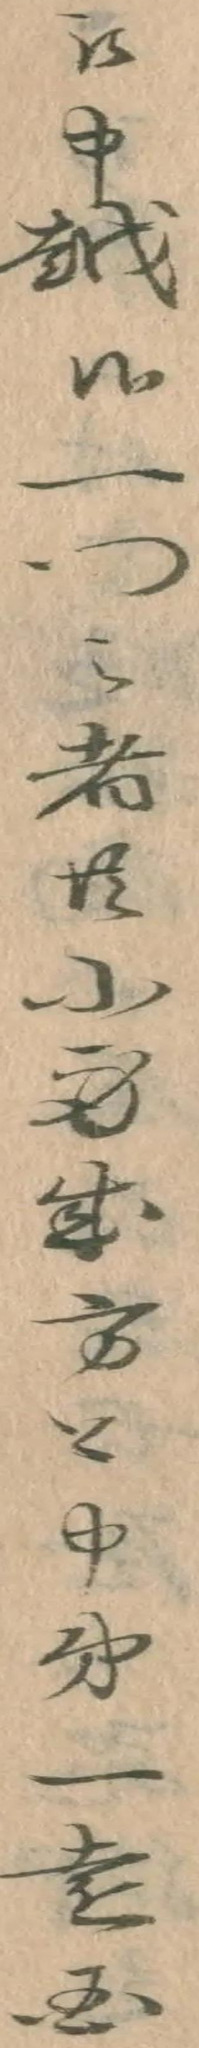被申越候一門之者共小身成方と申第一遠国
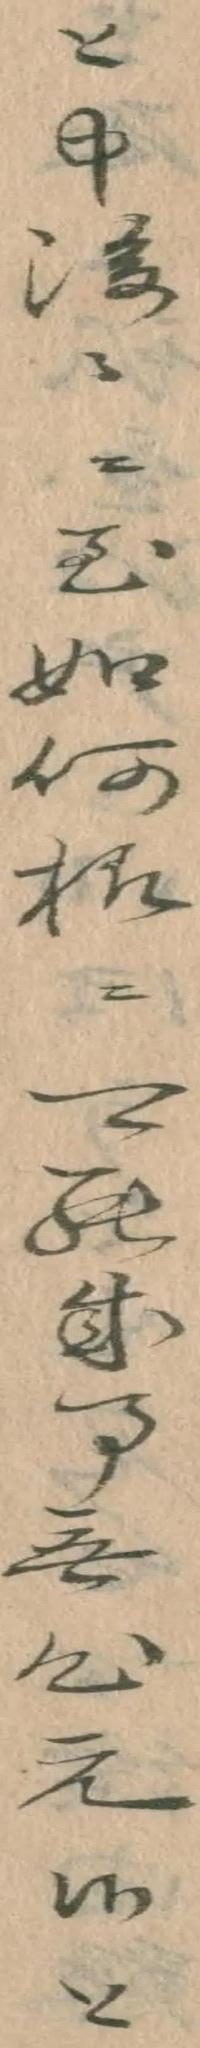と申後々に至如何様に可罷成事無心元候と
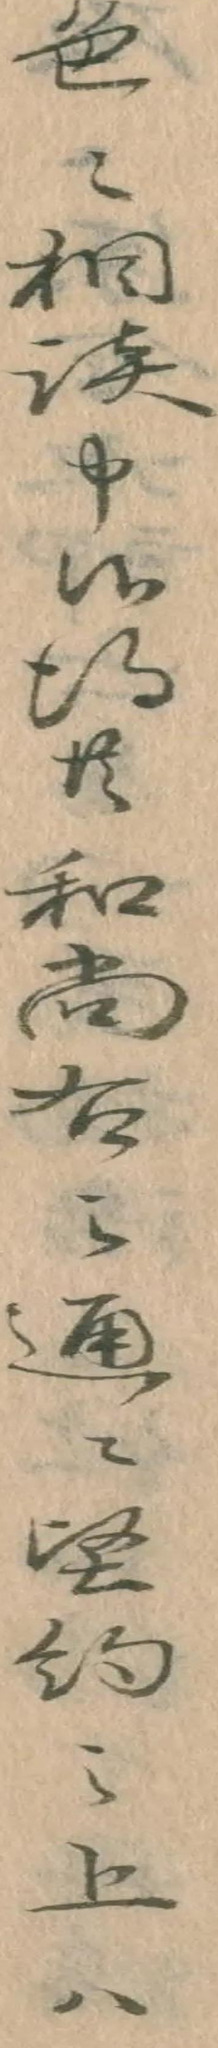色々相談申候得共和尚右之通に堅約之上は
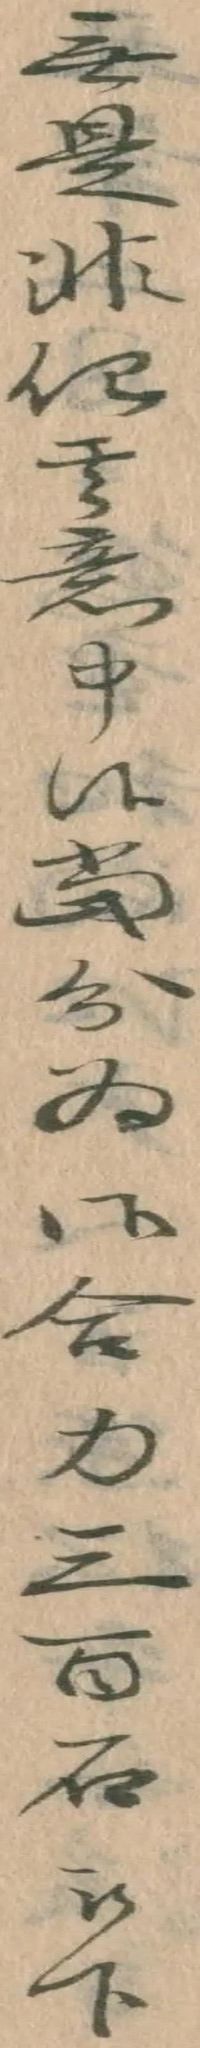無是非任其意申候当分為御合力三百石被下
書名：切支丹御退治記 49巻. [3]
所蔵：国立国会図書館 National Diet Library, JAPAN
